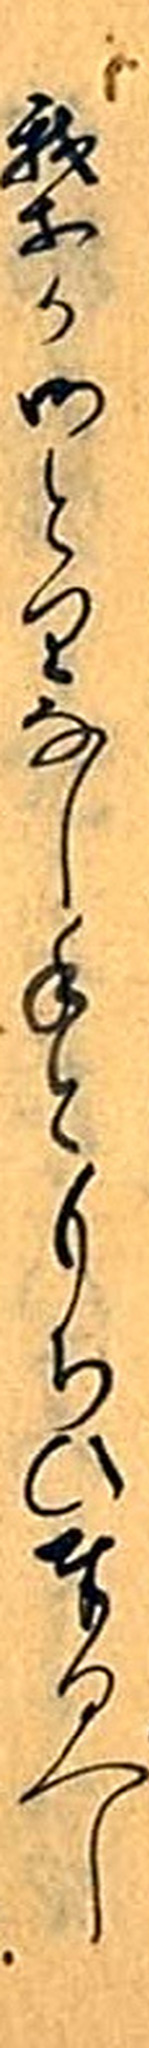我等か御とりなし手ともちひ奉るへし
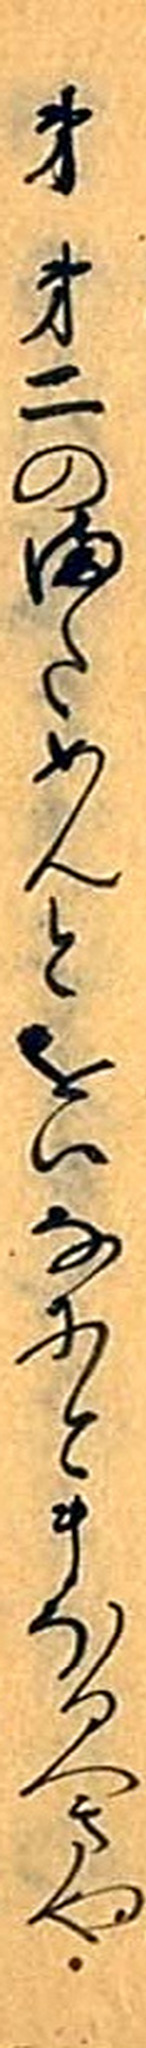弟第二のまためんとをはなにとまほるへきや
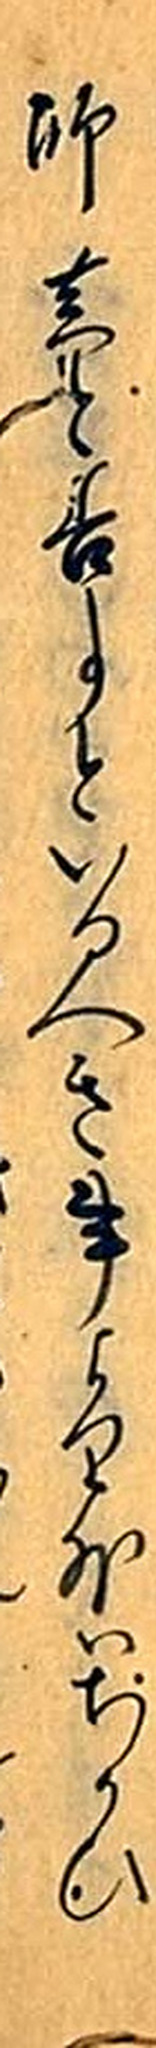師真と善事といるへき事より外はちかひ
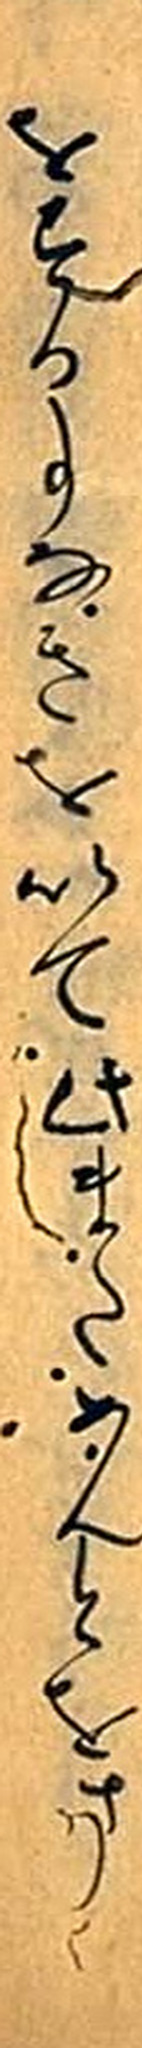をする事なきを以て此まためんとをま
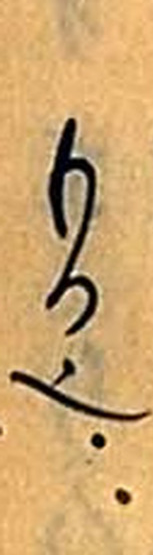もる也
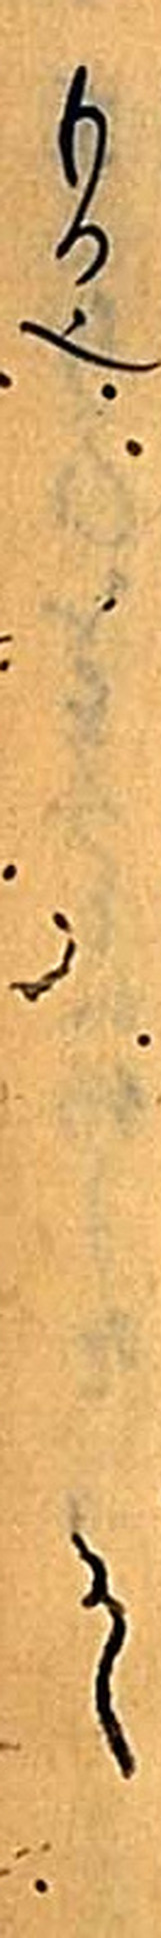もる也

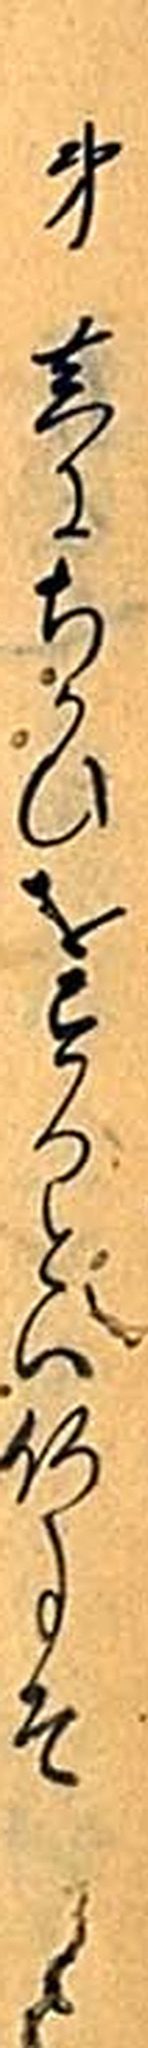弟真にちかひをするとは何事そ
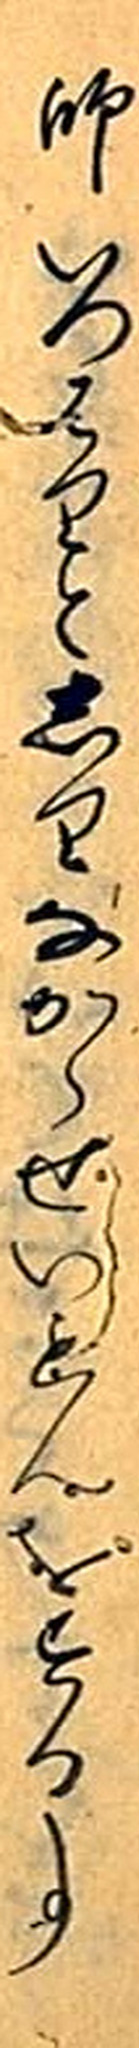師いつはりとしりなからせいもんをする事
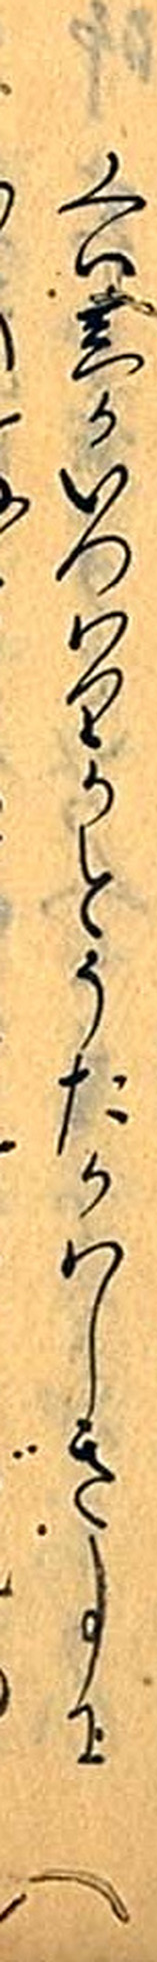又は真かいつはりかとうたかはしき事に
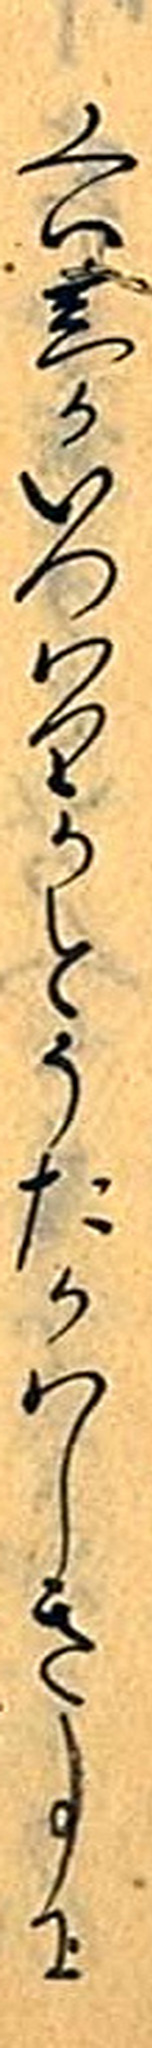又は真かいつはりかとうたかはしき事に
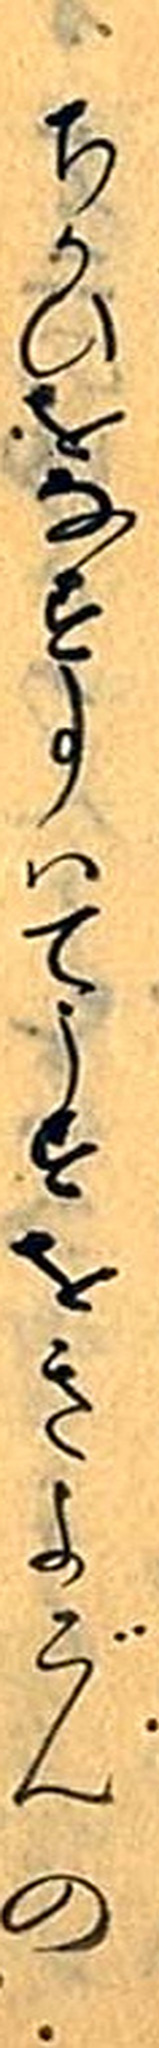ちかひをなす事はてうすをきよごんの
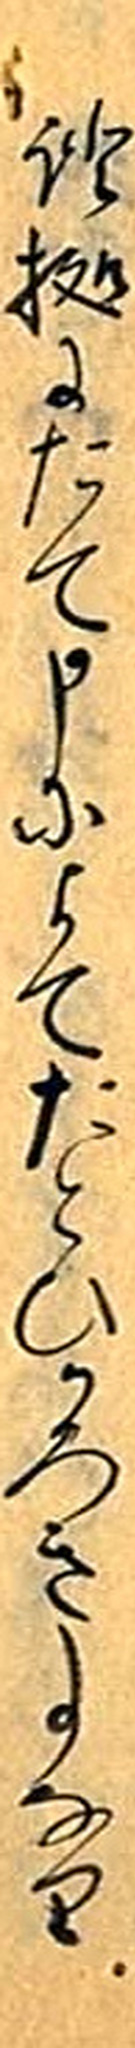証拠にたて申によてたとひかろき事なり
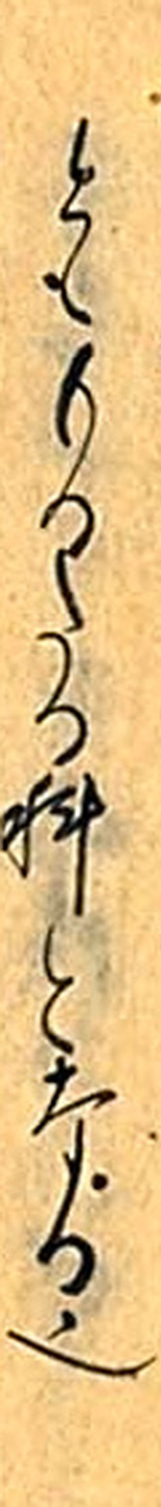とももるたる科となる也
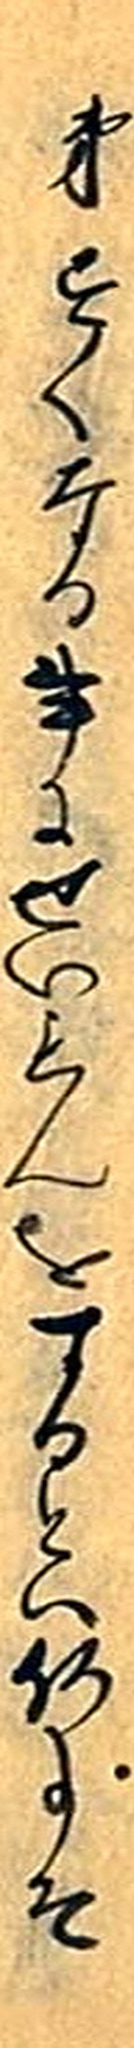弟すくなる事にせいもんをするとは何事そ
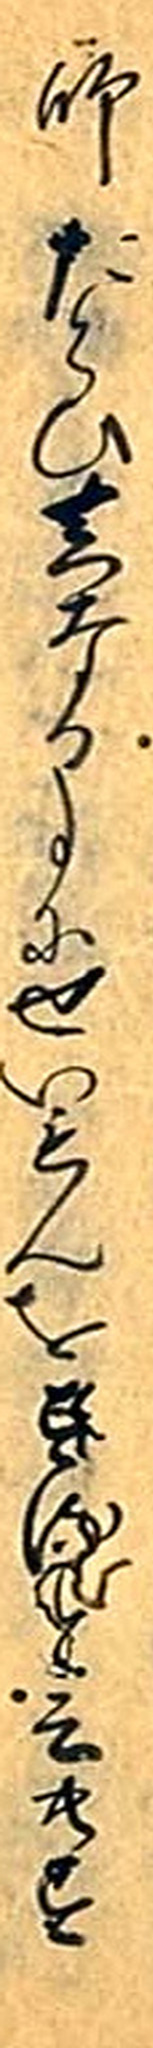師たとひ真なる事にせいもんをすると云共す
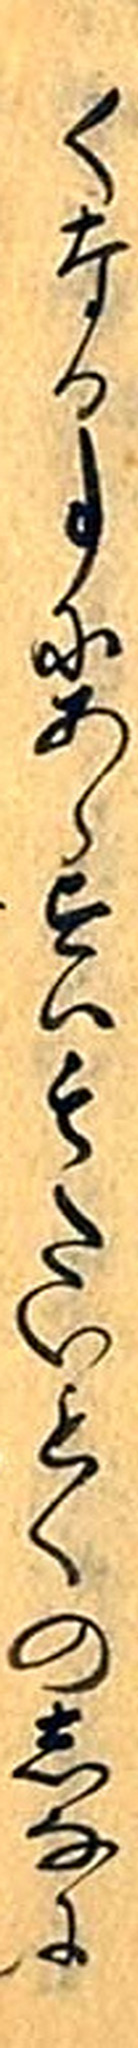くなる事にあらすは其たいもくのしなに
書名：ドチリナ・キリシタン
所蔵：東京大学総合図書館 / General Library in the University of Tokyo
